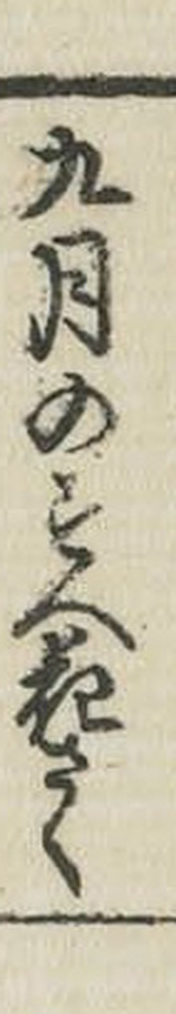九月のすへ花さく
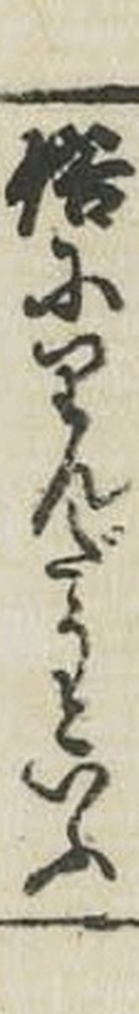俗にりんだうといふ
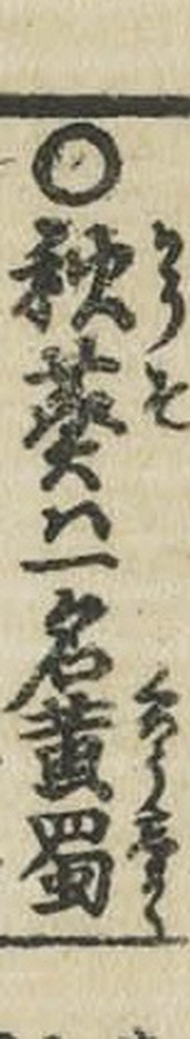○秋葵は一名黄蜀
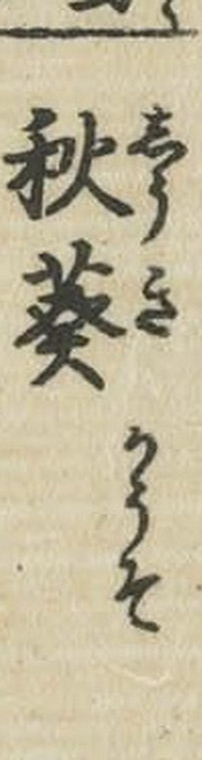秋葵かうそ
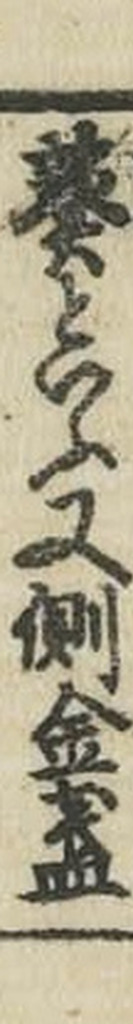葵といふ又側金盞
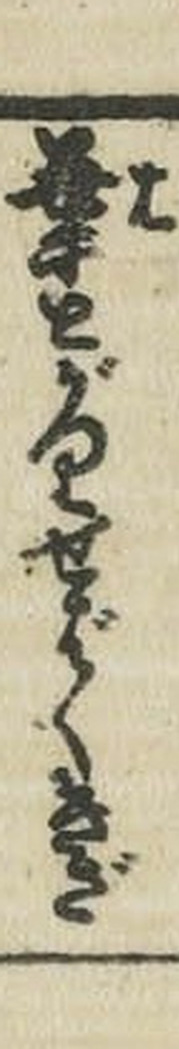葉とがりせばくきざ
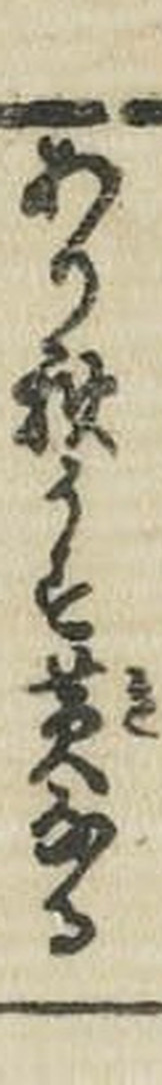あり秋うす黄なる
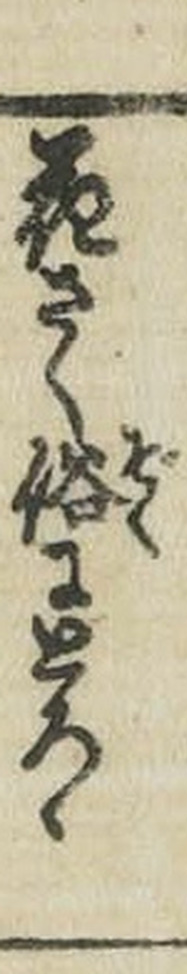花さく俗にとろゝ
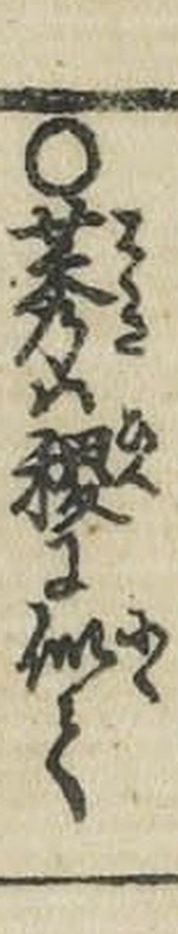○莠は稷に似て
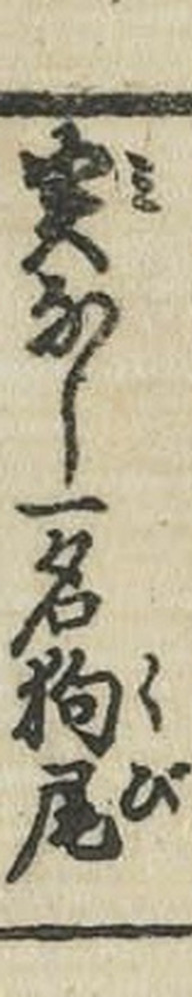実なし一名狗尾
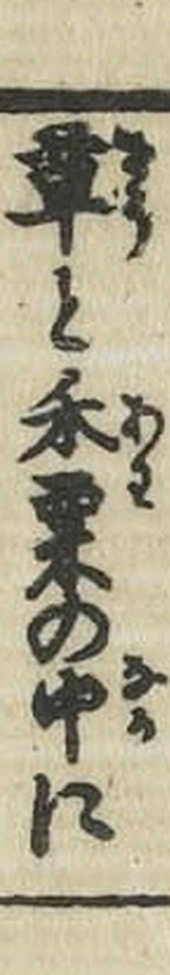草と禾粟の中に
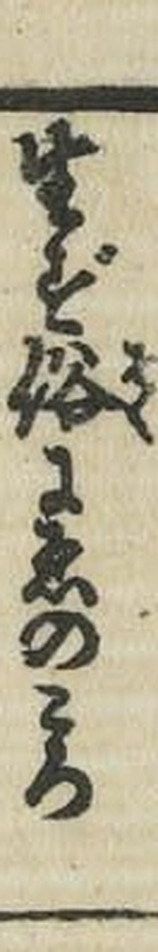生ず俗にゑのころ
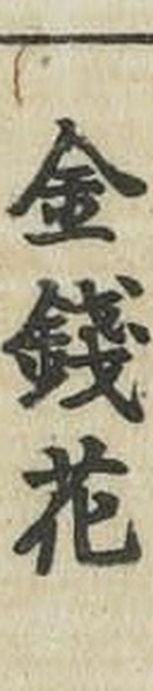金銭花
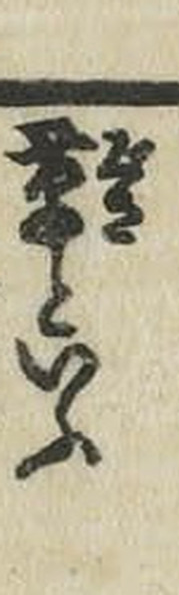草といふ
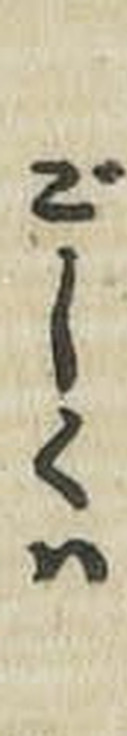ごしくは
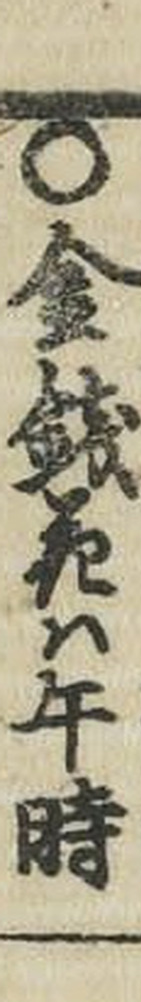○金銭花は午時
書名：増補頭書訓蒙図彙大成 10巻 9:巻之20
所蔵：東京学芸大学教育コンテンツアーカイブ
